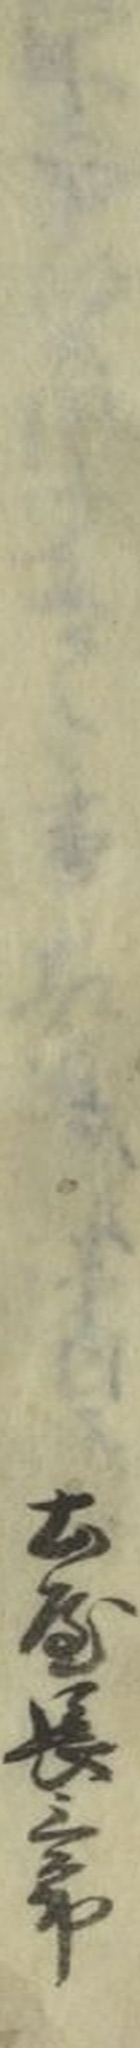土屋長三郎
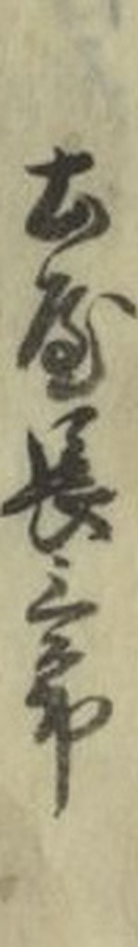土屋長三郎
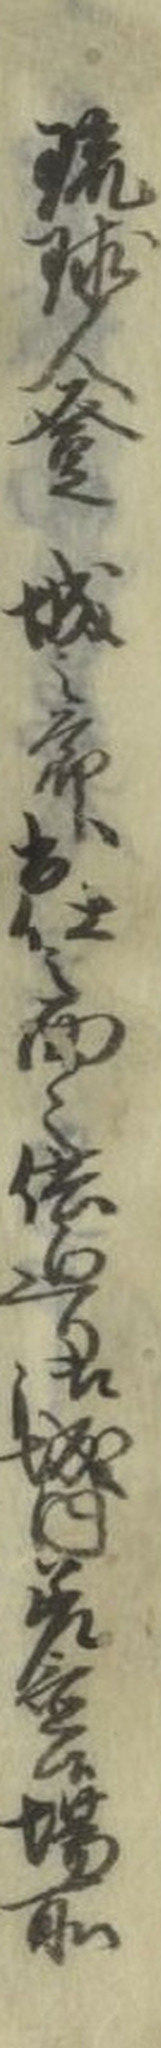琉球人登城之節は出仕之面々供廻り御城内差置候場所
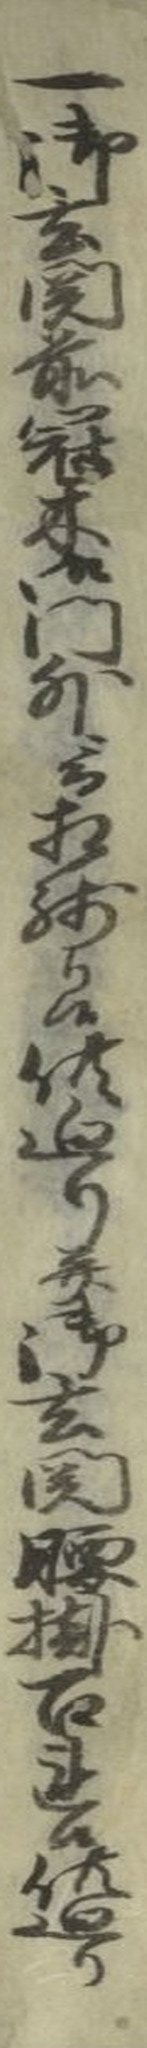一御玄関前冠木御門外にて相残り候供廻り幷御玄関腰掛召連候供廻り
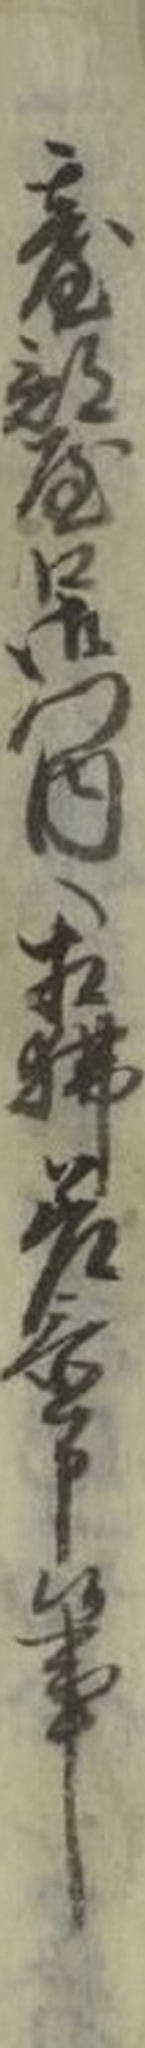部屋口御門内へ相払差置申候事
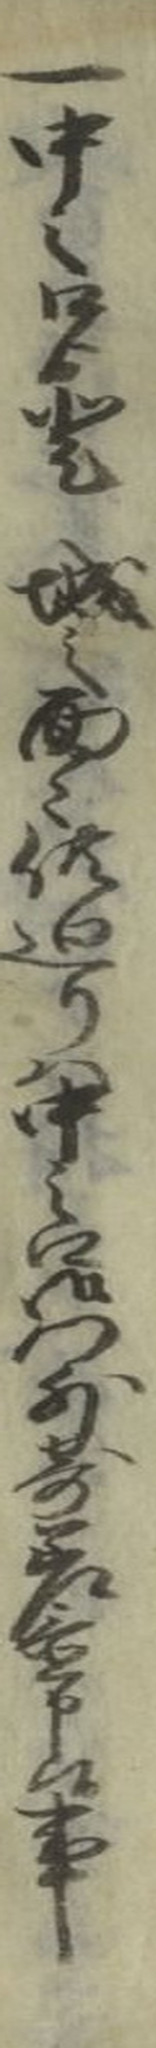一中之口ゟ登城之面々供廻りは中之口御門外寄差置申候事
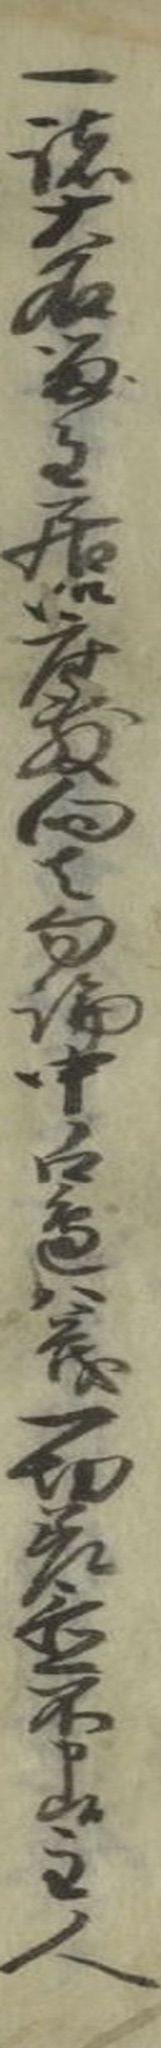一諸大名留守居御座敷向は勿論中之口辺へも一切差置不申候主人
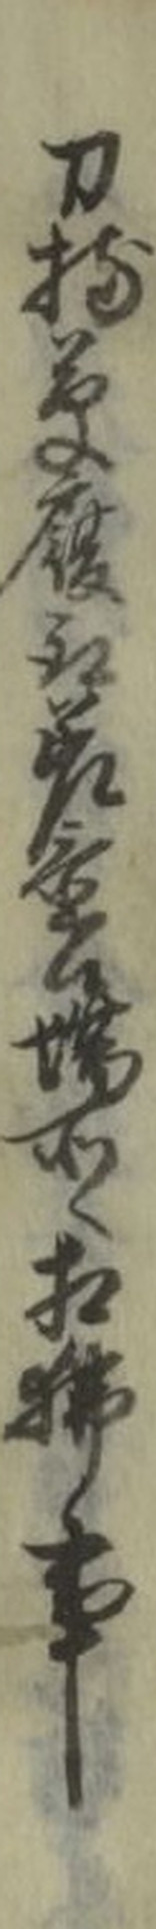刀持草履取差置候場所へ相払候事
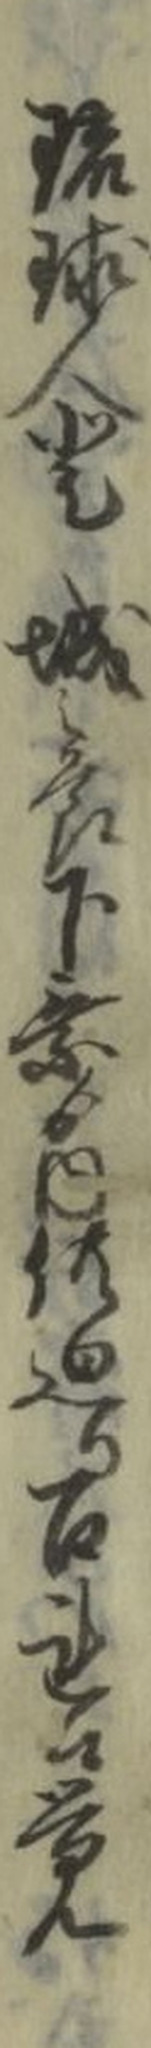琉球人登城之節下乗ゟ内供廻り召連候覚

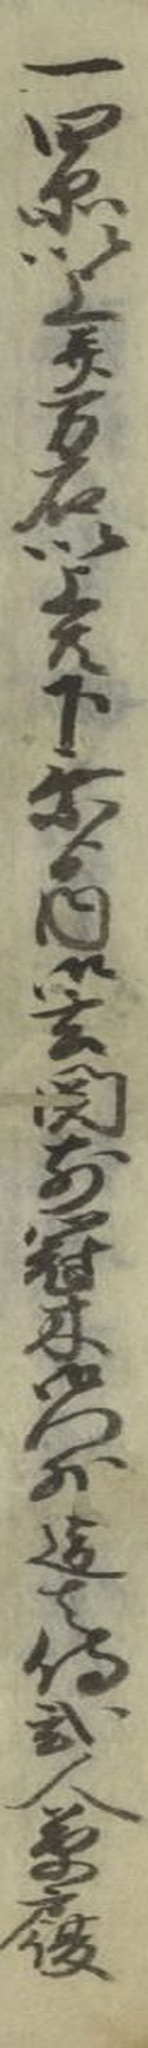一四品以上并万石以上共下乗ゟ内御玄関前冠木御門外迠は侍二人草履
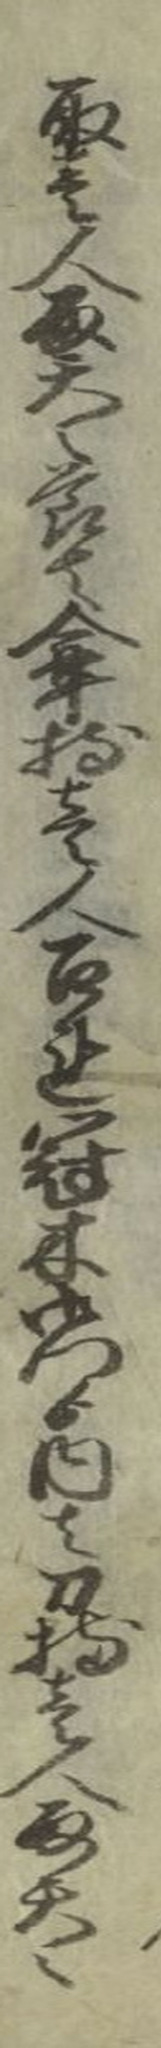取一人雨天之節は傘持一人召連冠木御門ゟ内は刀持一人雨天之
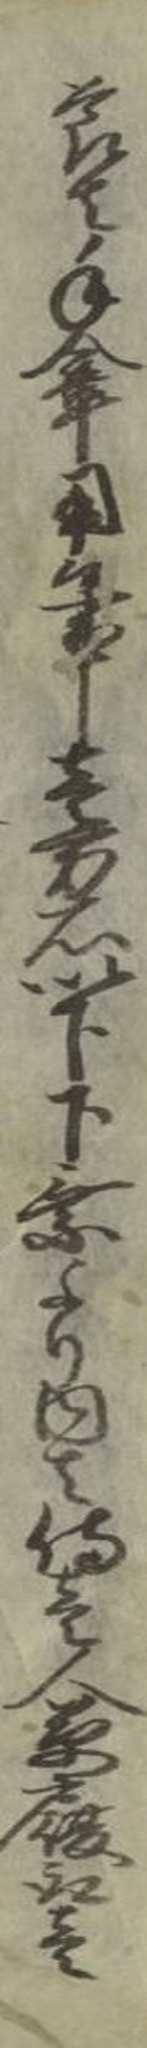節は手傘用候事一万石以下下乗より内は侍一人草履取一
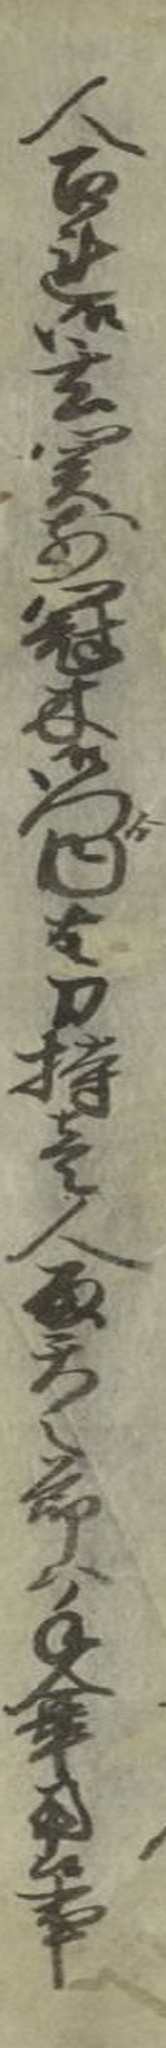人召連御玄関前冠木御門ゟ内は刀持一人雨天之節は手傘用候事
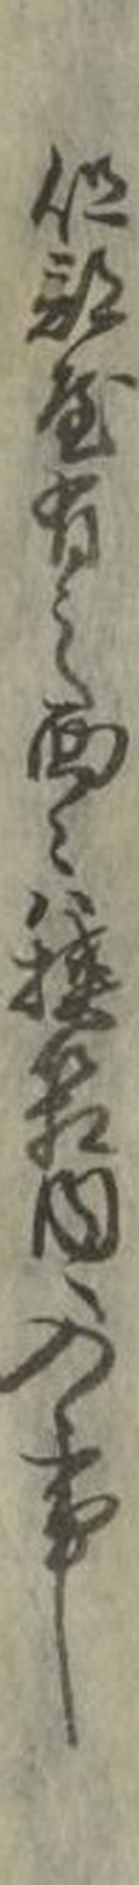但部屋有之面々は挟箱内へ入事
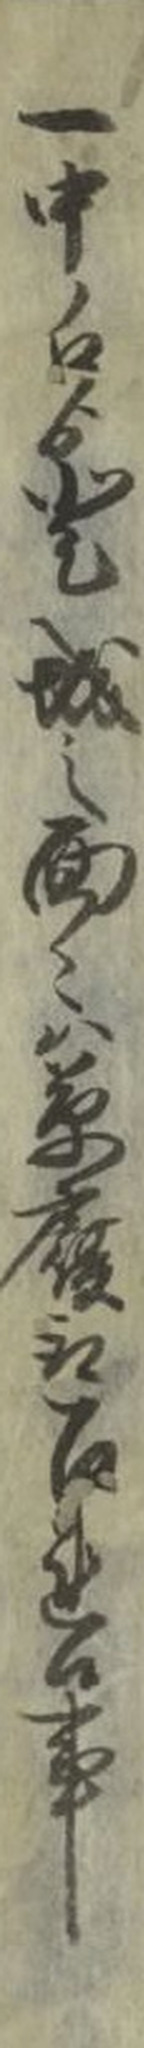一中之口ゟ登城之面々は草履取召連候事
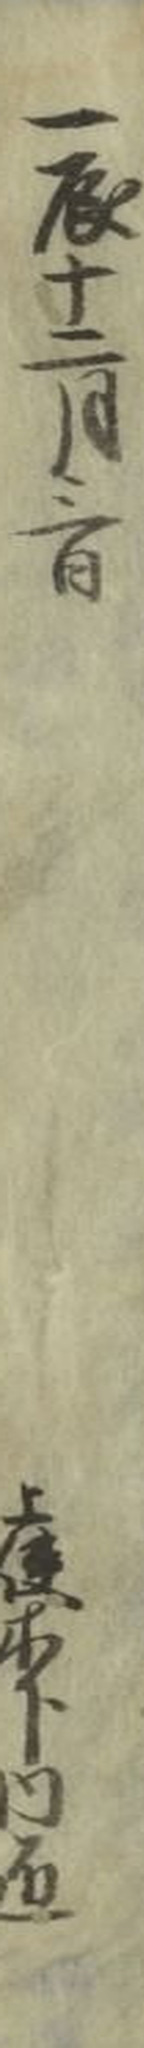一辰十二月三日上使右下内匠
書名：琉球人来朝之記
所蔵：University of the Ryukyus Library
